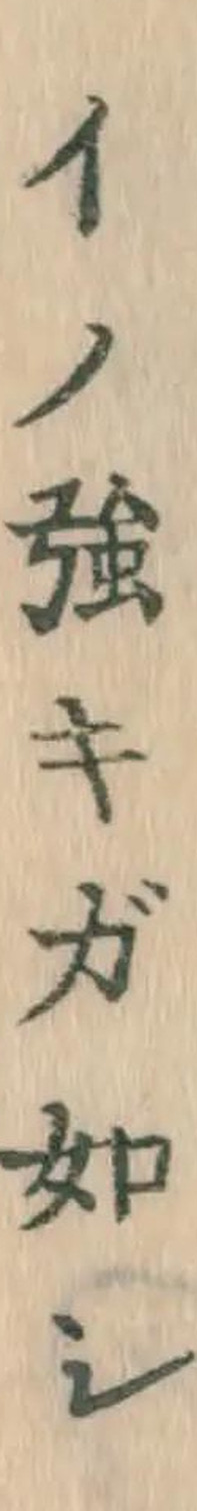イノ強キガ如シ
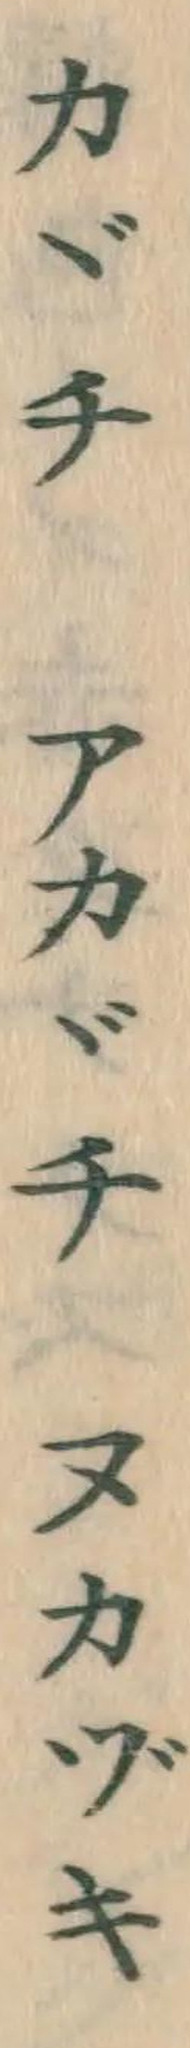カヾチアカヾチヌカヅキ

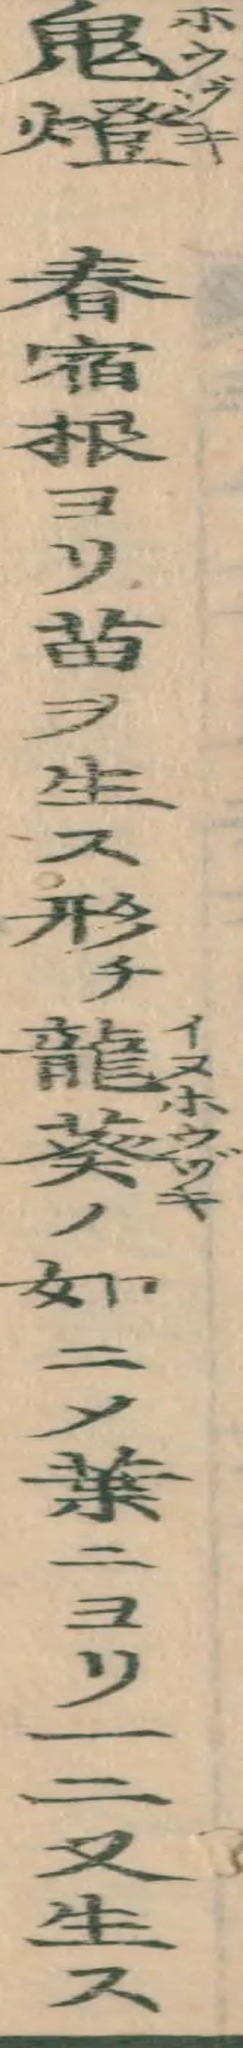鬼燈春宿根ヨリ苗ヲ生ス形竜葵ノ如ニシテ葉ニヨリ一二叉生ス
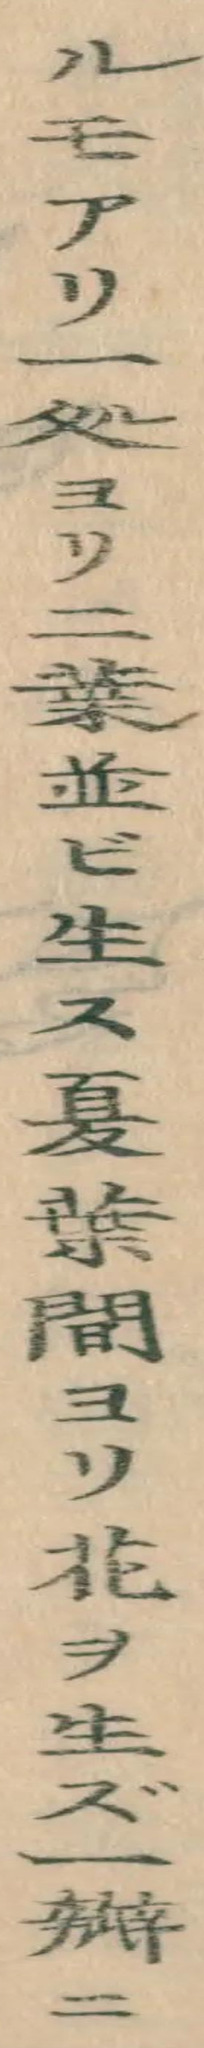ルモアリ一処ヨリ二葉並ビ生ス夏葉間ヨリ花ヲ生ズ一弁ニ
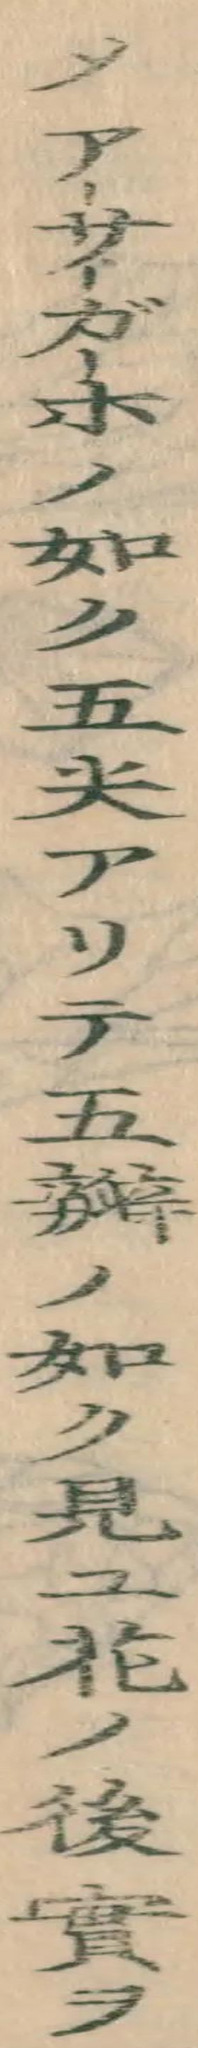シテア-サ-ガ-ホノ如ク五尖アリテ五弁ノ如ク見ユ花ノ後実ヲ
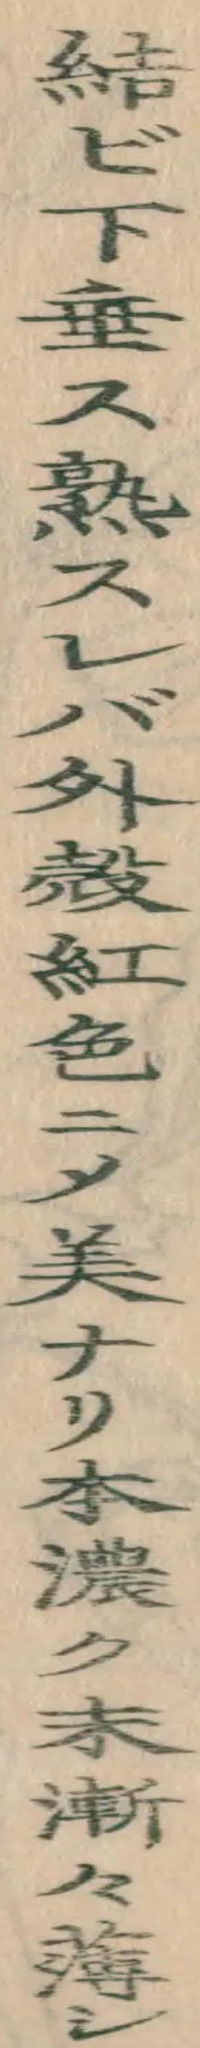結ビ下垂ス熟スレバ外殻紅色ニシテ美ナリ本濃ク末漸々薄シ
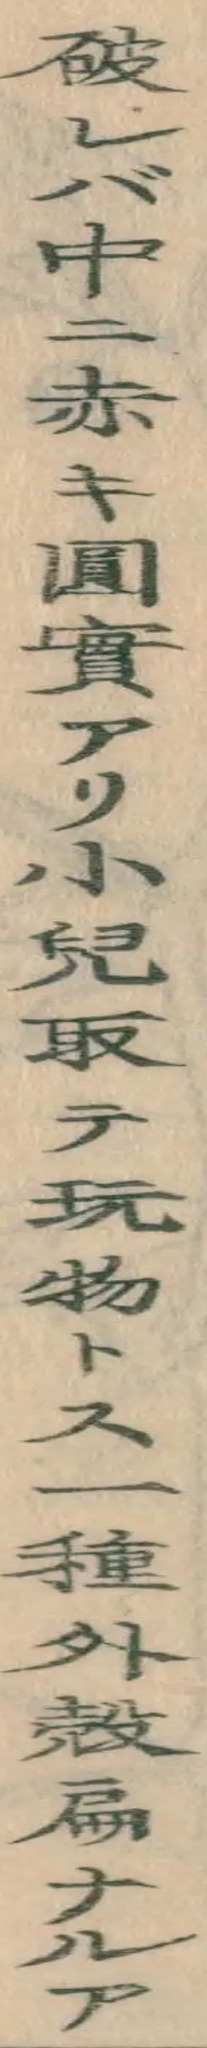破レバ中ニ赤キ円実アリ小児取テ玩物トス一種外殻扁ナルア
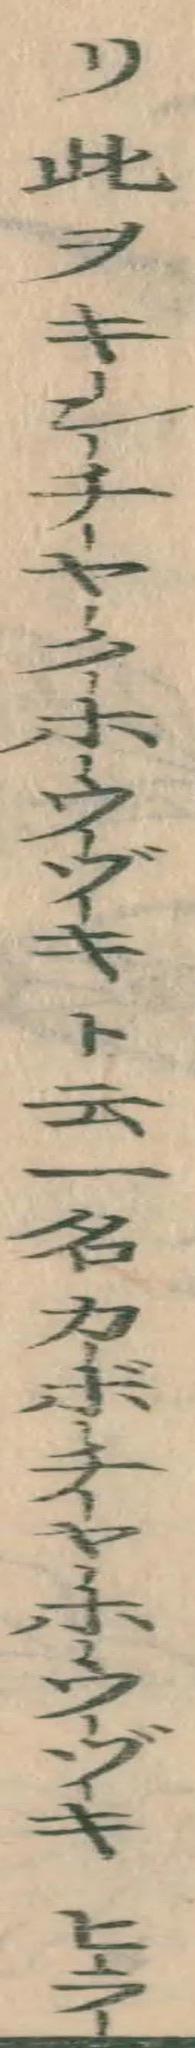リ此ヲキ-ン-チ-ヤ-ク-ホ-ウ-ヅ-キト云一名カ-ボ-チ-ヤ-ホ-ウ-ヅ-キヒ-ラ-
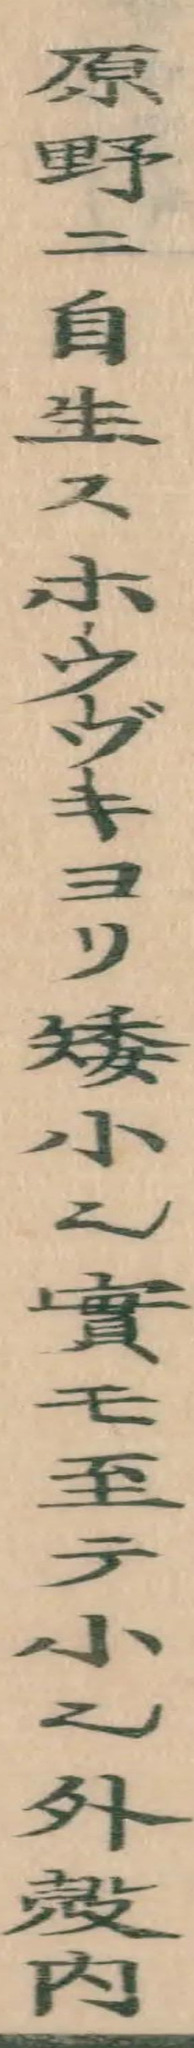原野ニ自生スホ-ウ-ヅ-キヨリ矮小也実モ至テ小也外殻内
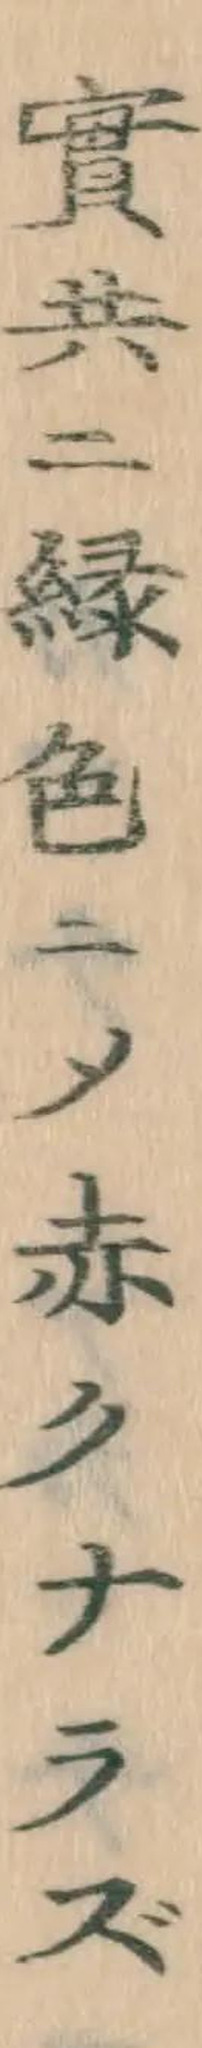実共ニ緑色ニシテ赤クナラズ
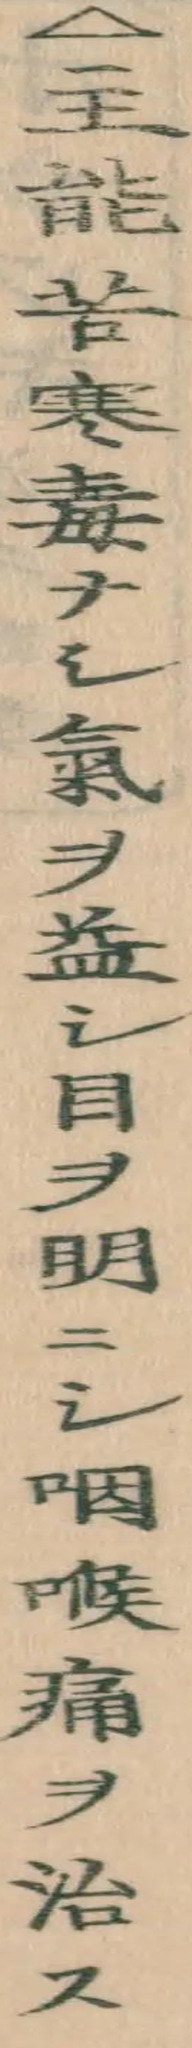△主能苦寒毒ナシ気ヲ益シ目ヲ明ニシ咽喉痛ヲ治ス

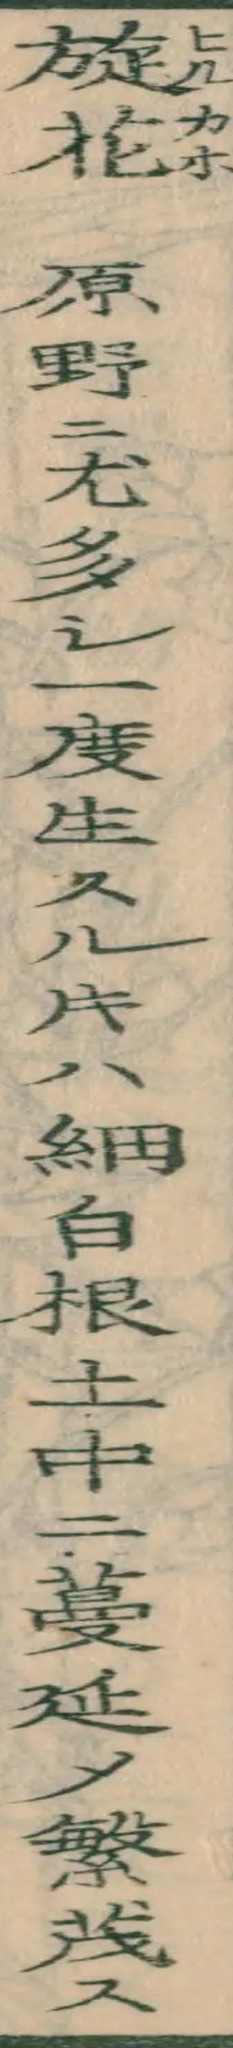旋花原野ニ尤多シ一度生スルトキハ細白根土中ニ蔓延シテ繁茂ス
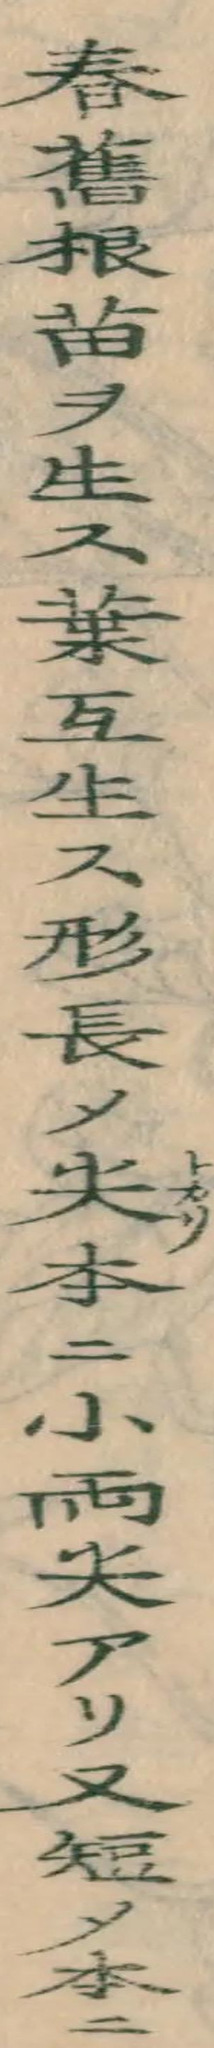春旧根苗ヲ生ス葉互生ス形長シテ尖本ニ小両尖アリ又短シテ本ニ
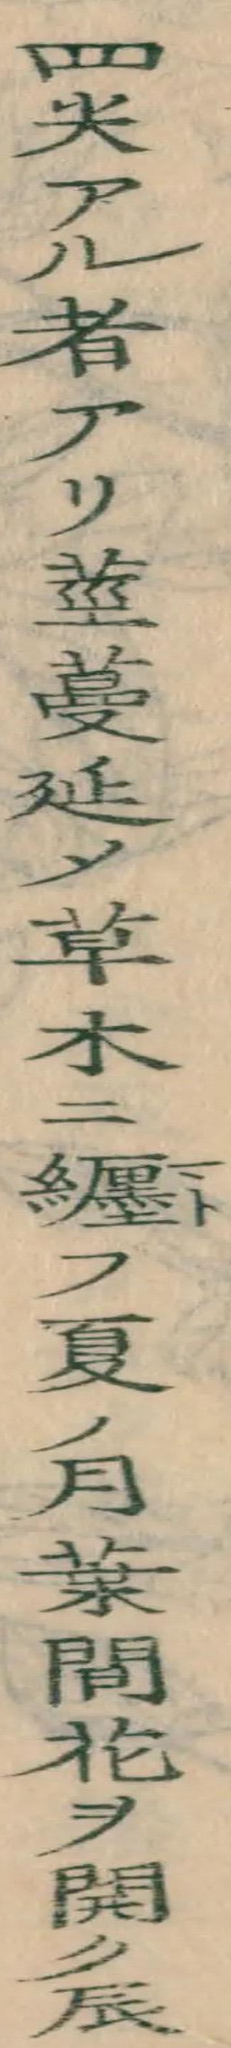四尖アル者アリ茎蔓延シテ草木ニ纏フ夏ノ月葉間花ヲ開ク辰
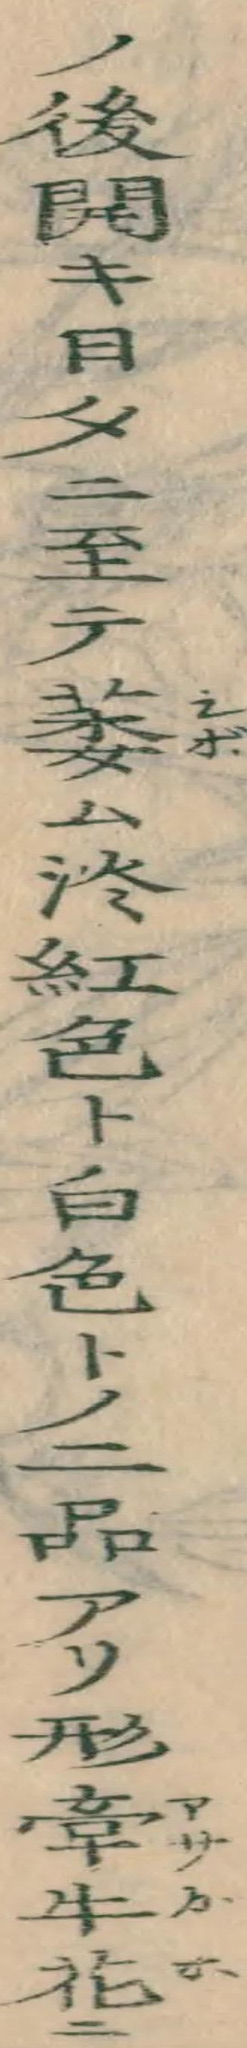ノ後開キ日夕ニ至テ萎ム淡紅色ト白色トノ二品アリ形牽牛花ニ
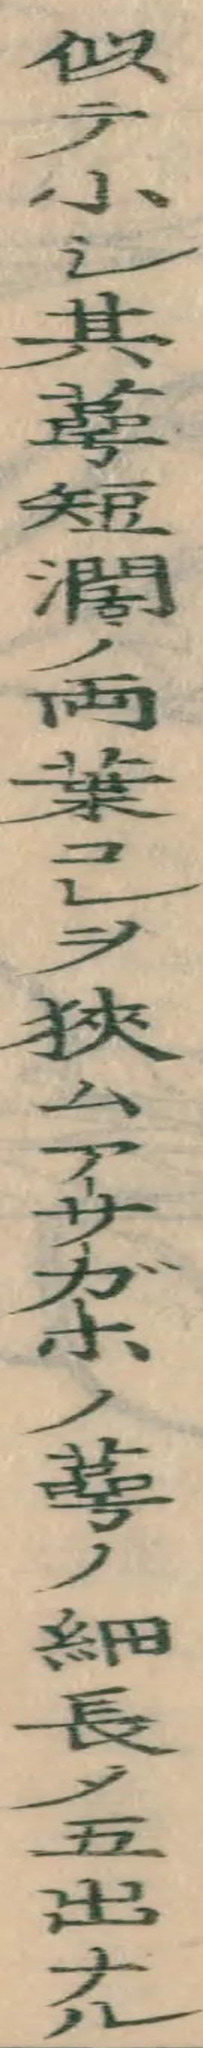似テ小シ其萼短闊ノ両葉コレヲ挟ムア-サ-ガ-ホノ萼ノ細長シテ五出ナル
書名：これこれ草 2巻. [2]
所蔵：国立国会図書館 National Diet Library, JAPAN
